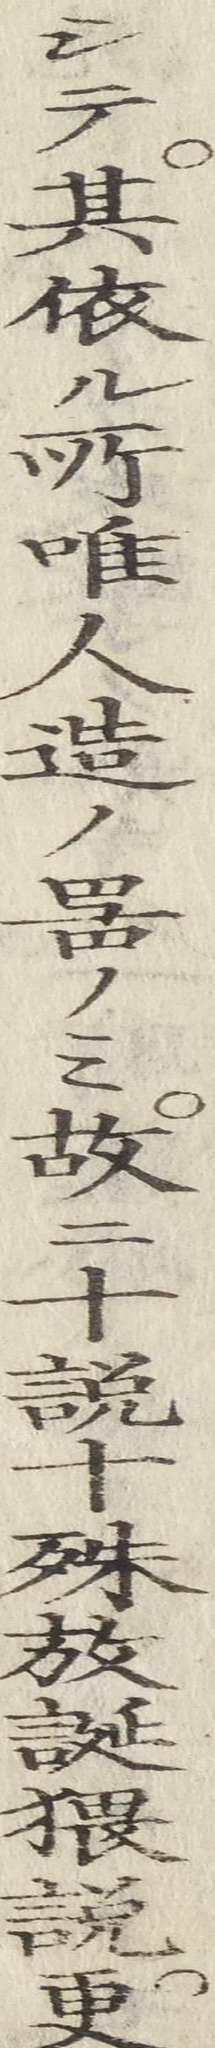シテ。其依ル所唯人造ノ器ノミ。故ニ十説十殊放誕猥説。更
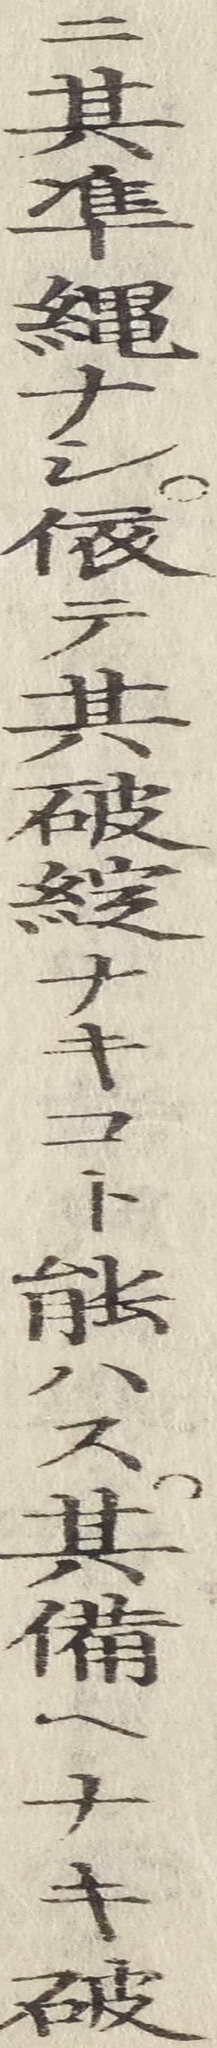ニ其準縄ナシ。依テ破綻ナキコト能ハス。其備ヘナキ破
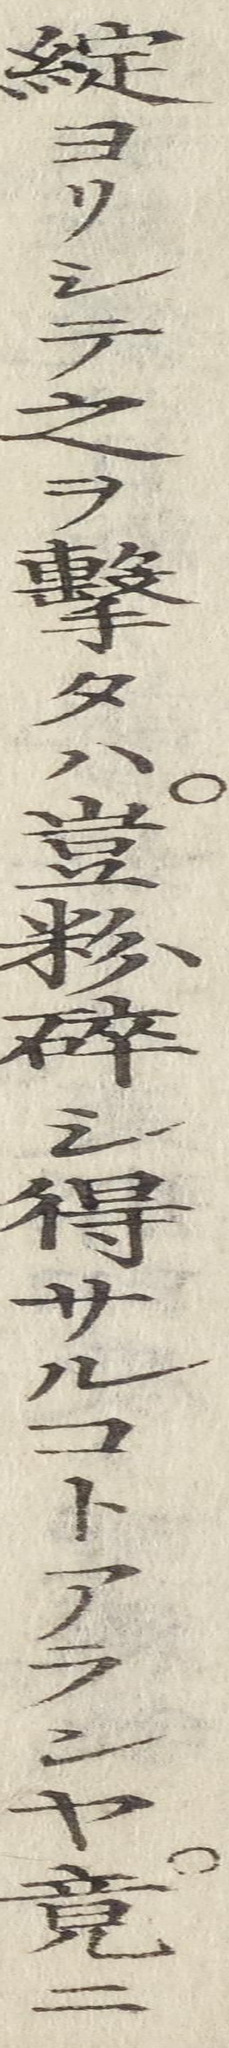綻ヨリシテ之ヲ撃タハ。豈粉砕シ得サルコトアランヤ。竟ニ
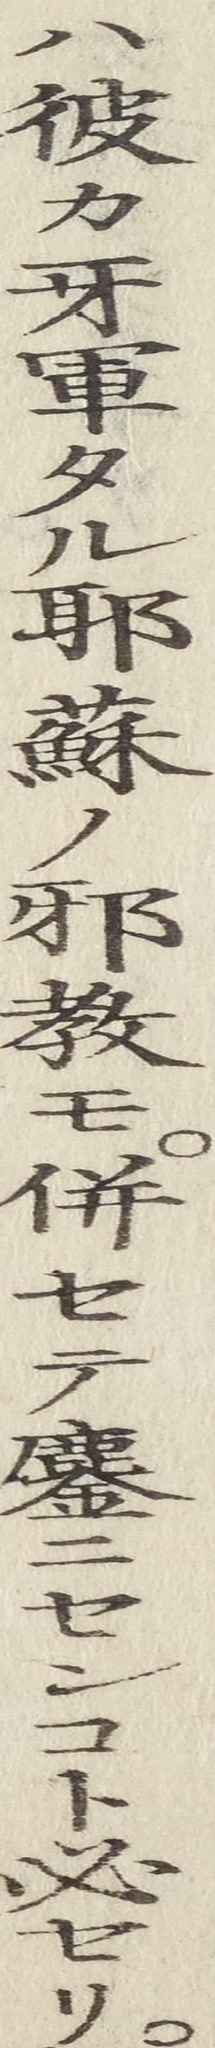ハ彼カ牙軍タル耶蘇ノ邪教モ。併セテ鏖ニセンコト必セリ。
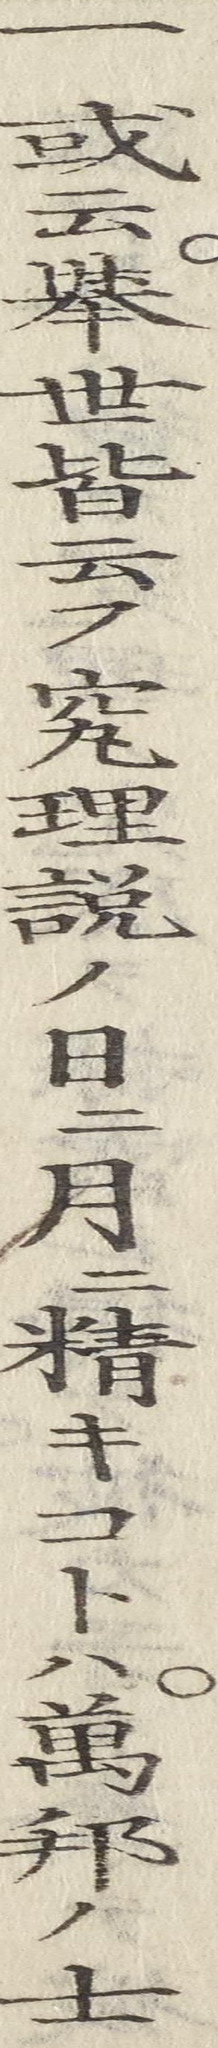一或云。挙世皆云フ究理説ノ日ニ月ニ精キコトハ。万邦ノ士
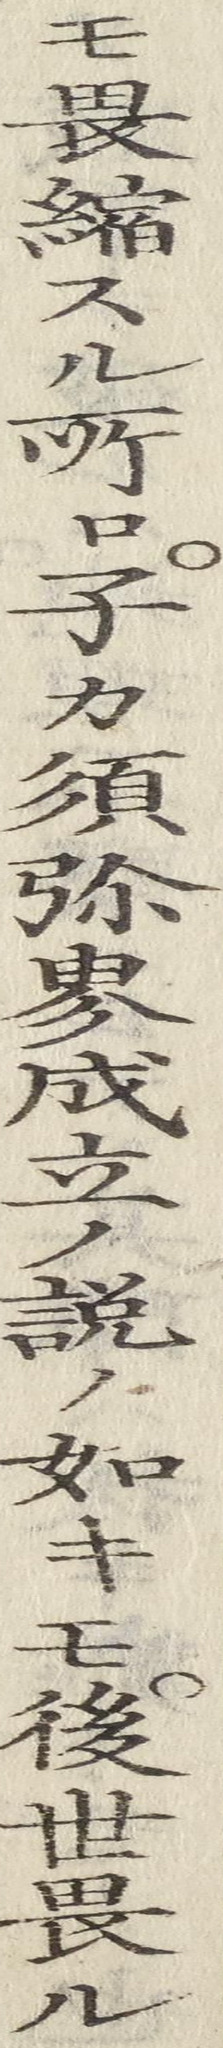モ畏縮スル所ロ。子カ須弥界成立ノ説ノ如キモ。後世畏ル
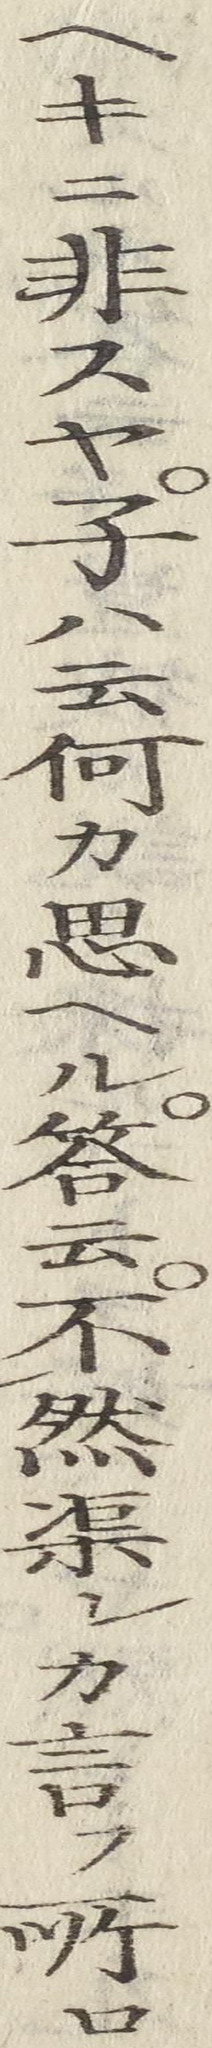ヘキニ非スヤ。子ハ云何カ思ヘル。答云。不然渠レカ言フ所ロ
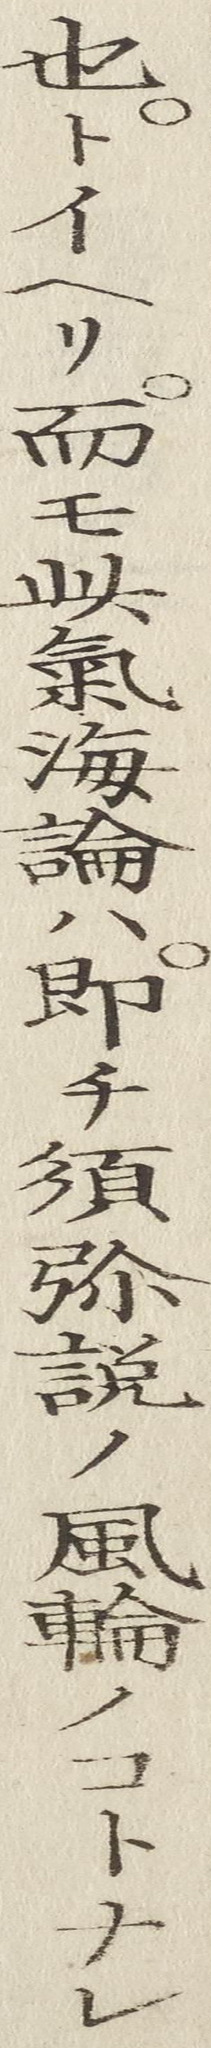也。トイヘリ。而モ此気海論ハ。即チ須弥説ノ風輪ノコトナレ
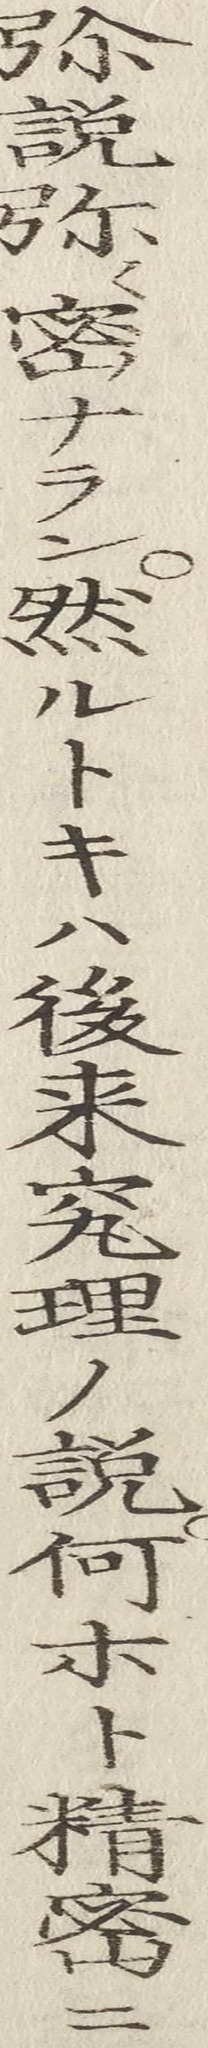弥説弥〱蜜ナラン。然ルトキ後来究理ノ説。何ホト精密ニ
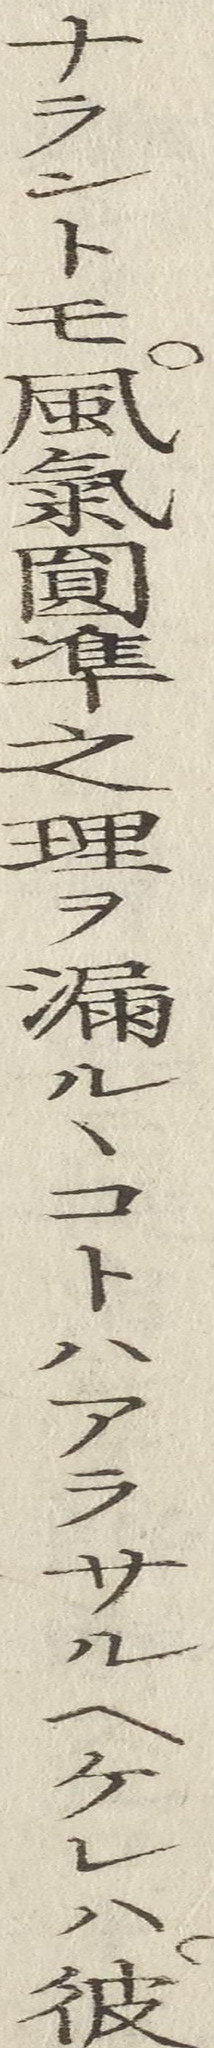ナラントモ。風気円準之理ヲ漏ルヽコトハアラサルヘケレハ。彼
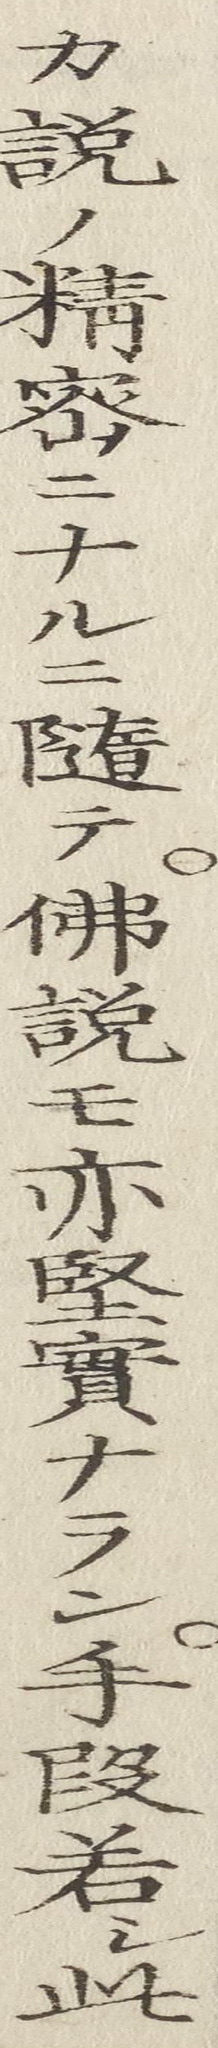カ説ノ精密ニナルニ随テ。仏説モ亦堅実ナラン。手段若シ此
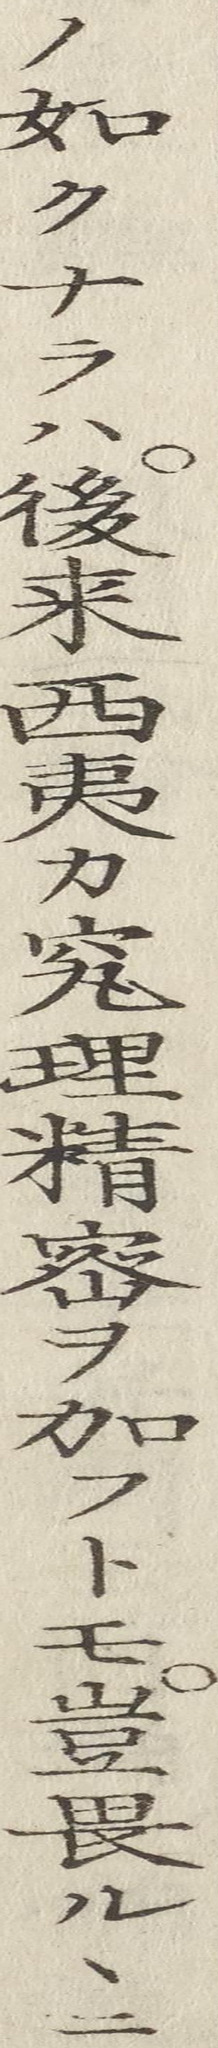ノ如クナラハ。後来西夷カ究理精密ヲ加フトモ。豈畏ルヽニ
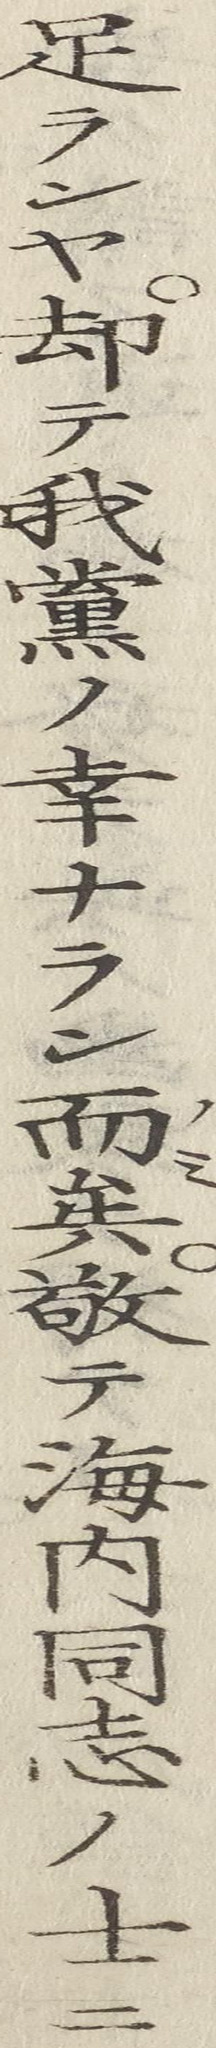足ランヤ。却テ我黨ノ幸ナラン而矣。敬テ海内同志ノ士ニ

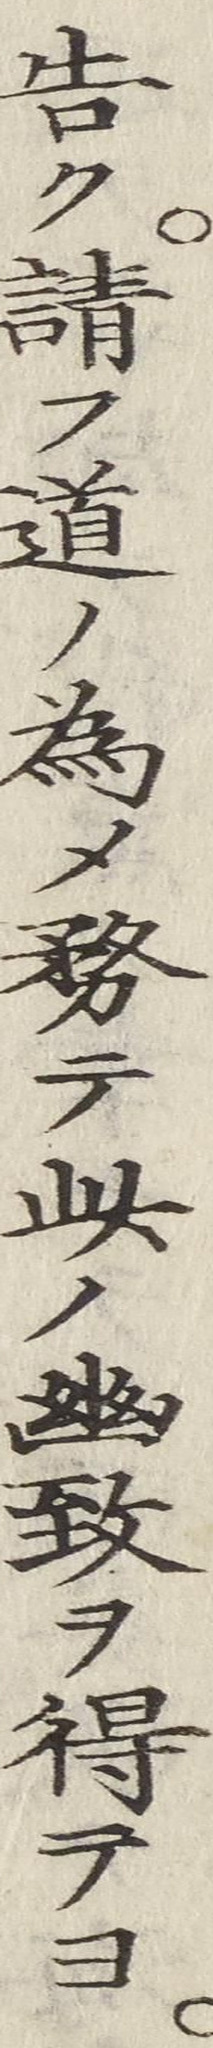告ク。請フ道ノ為メ努テ此ノ幽致ヲ得テヨ。
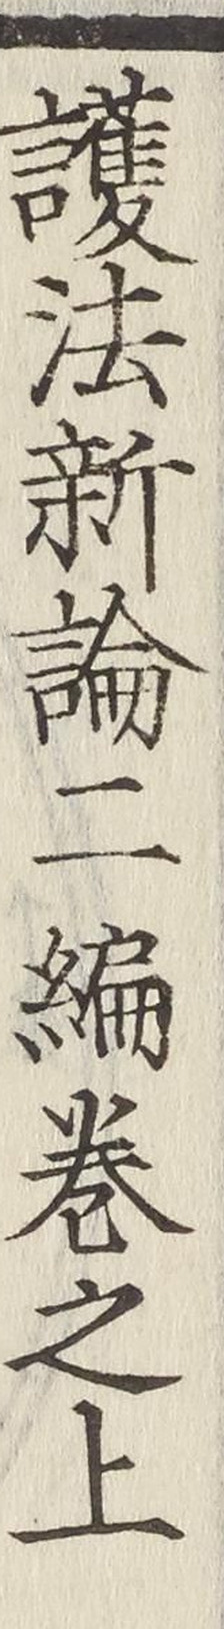護法新論ニ編巻之上
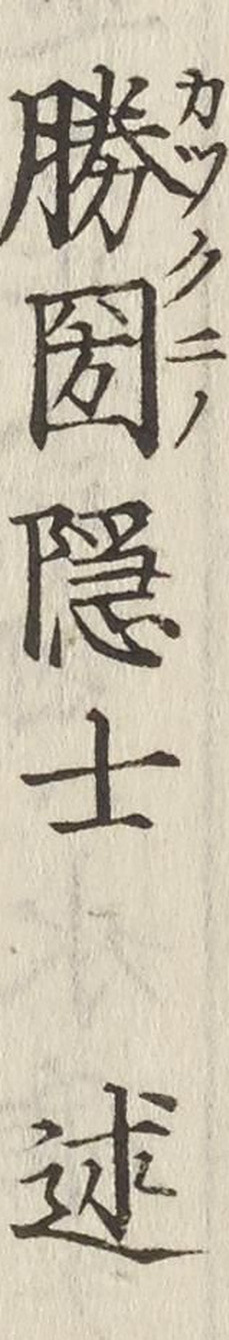勝国隠士述
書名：護法新論　二編　上
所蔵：東京大学地震研究所図書室 Earthquake Research Institute Library, The University of Tokyo, JAPAN
